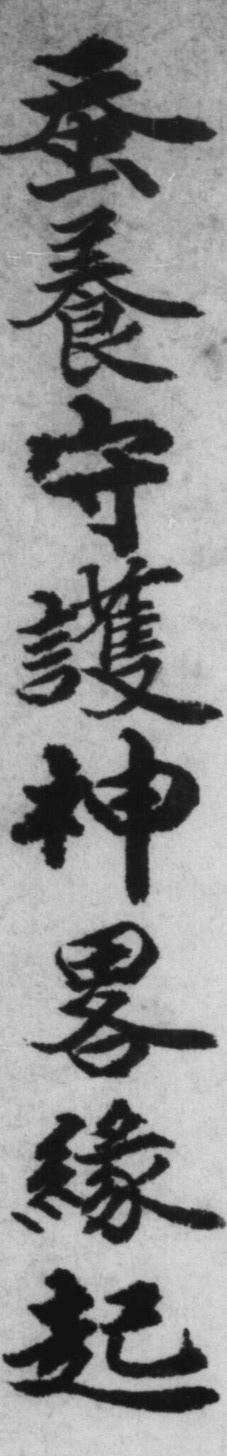蚕養守護神略縁起

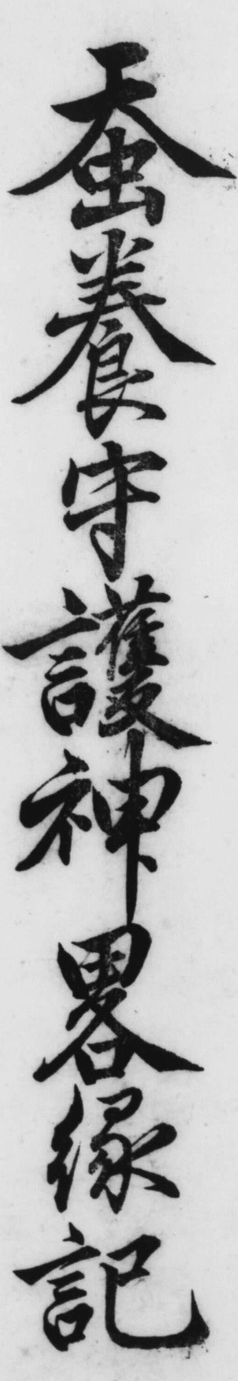蚕養守護神略縁記

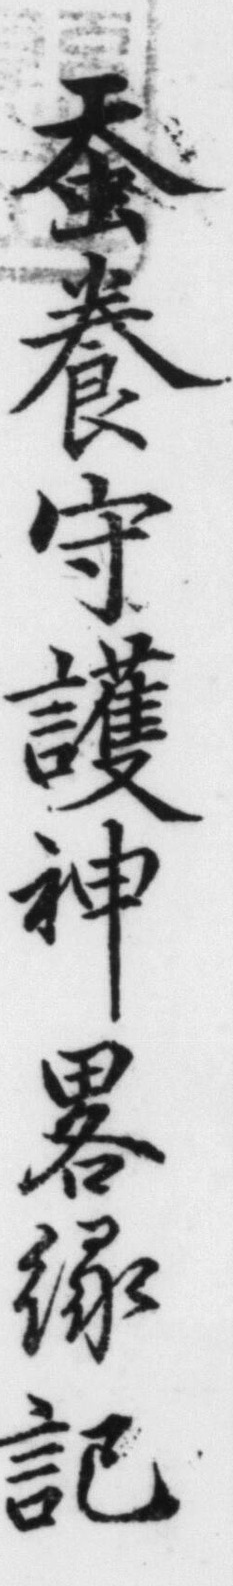蚕養守護神略縁記
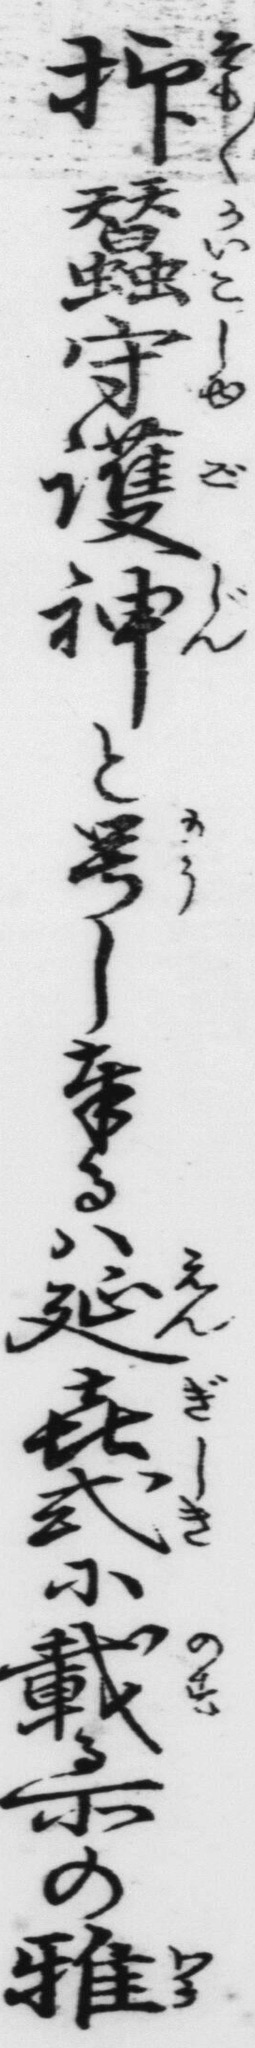抑蚕守護神と号し奉るは延喜式に載る所の雅
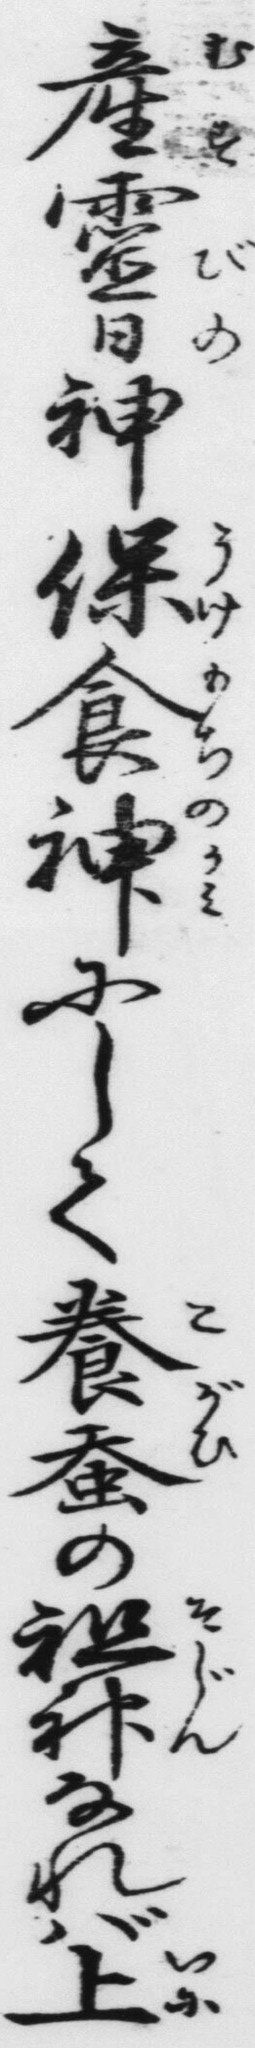産霊日神保食神にして養蚕の祖神なれば上
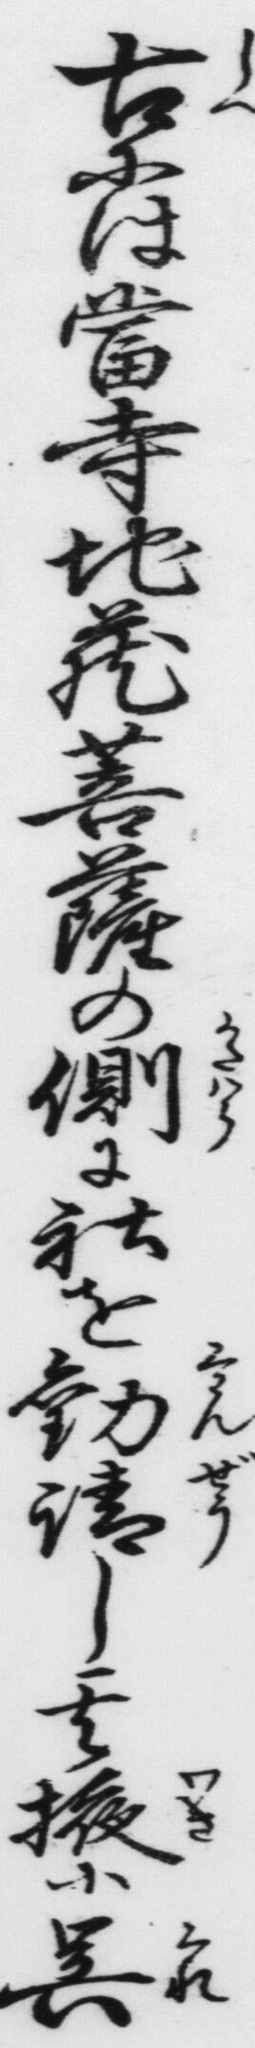古には当寺地蔵菩薩の側に社を勧請し其掖に呉
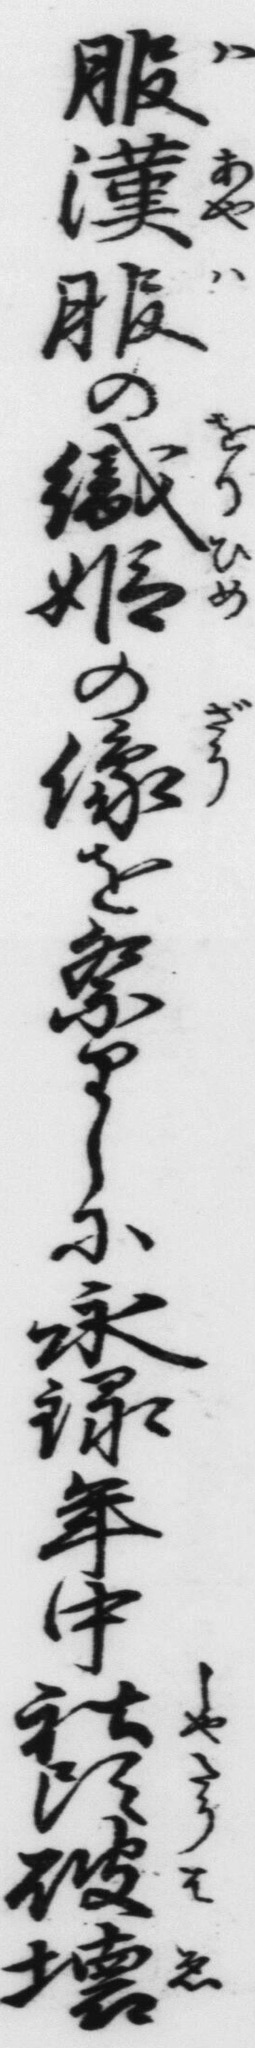服漢服の織姫の像を祭りしに永禄年中社頭破壊
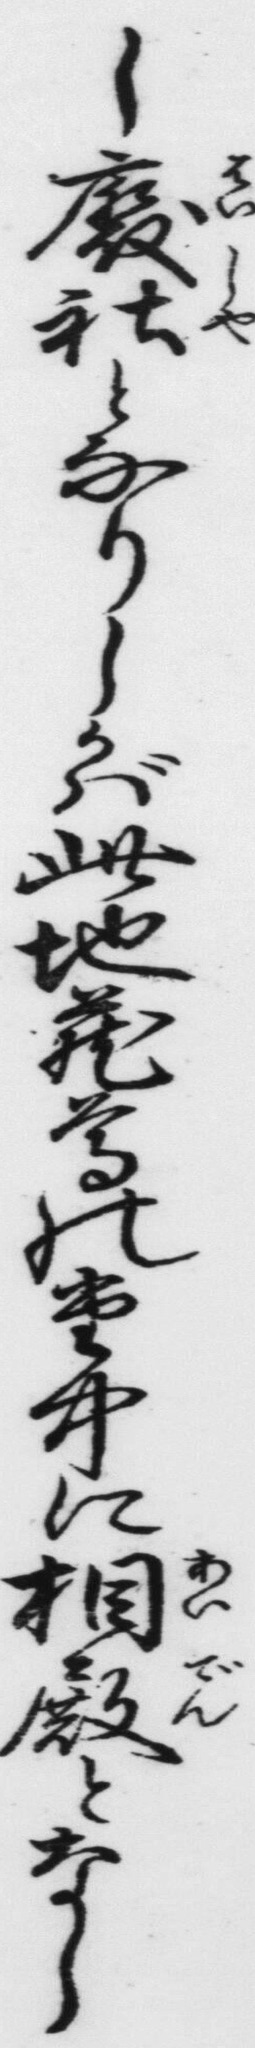し廃社となりしかば此地蔵尊の堂中に相殿となし
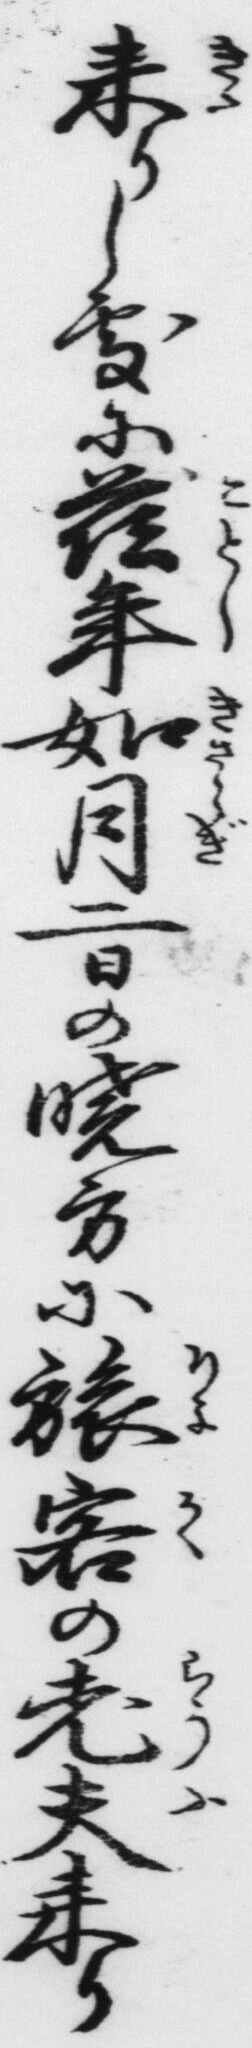来りし処に茲年如月二日の暁方に旅客の老夫来り
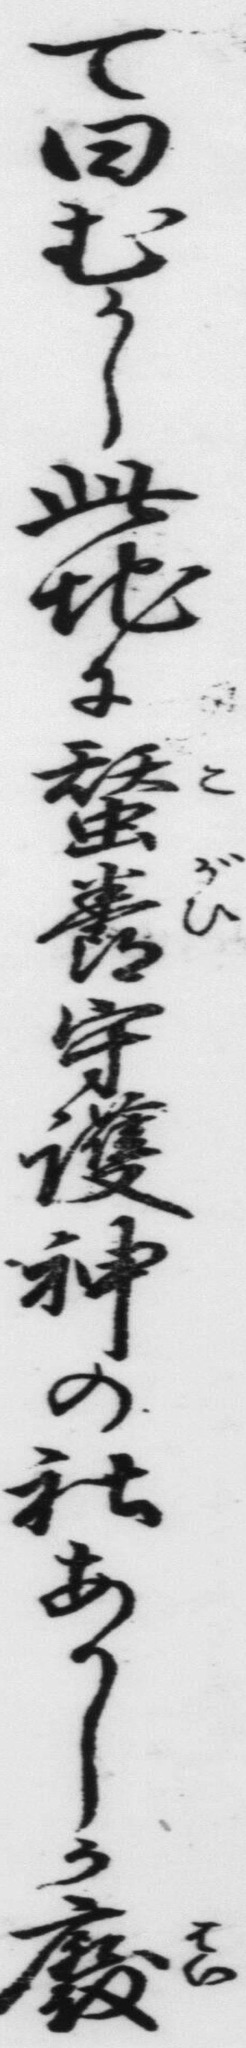て曰むかし此地に蚕養守護神の社ありしか廃
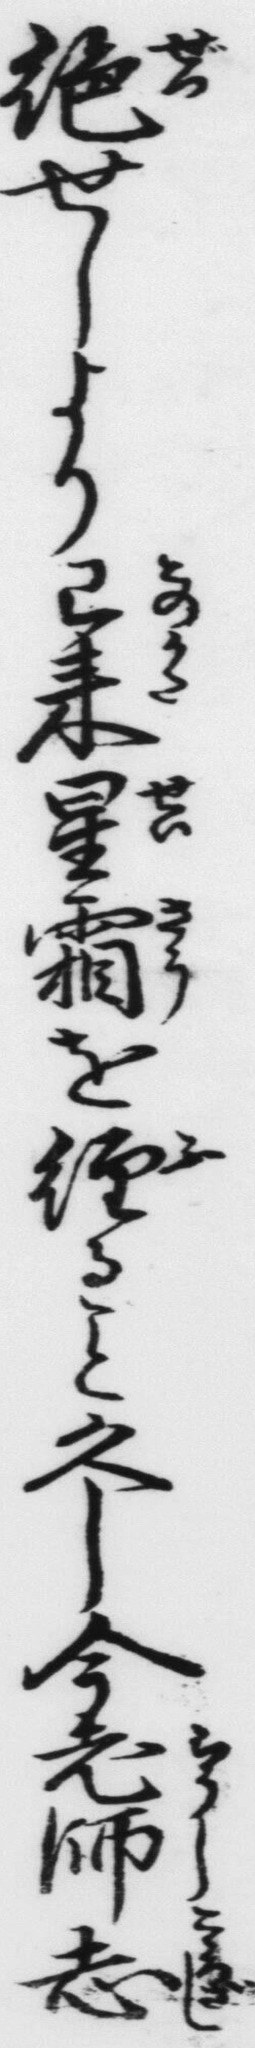絶せしより已来星霜を経ること久し今老師志
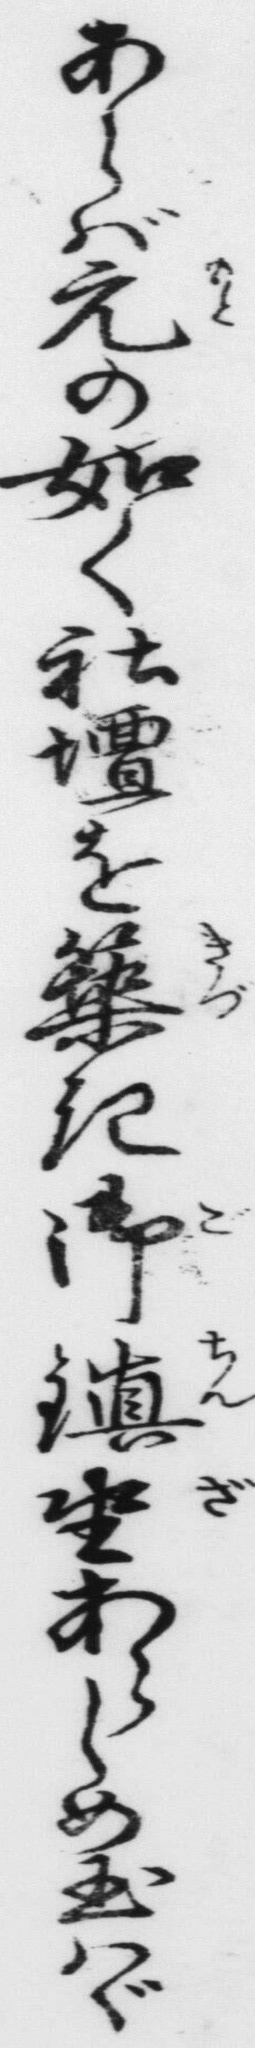あらば元の如く社壇を築き御鎮坐あらしめ玉はゞ
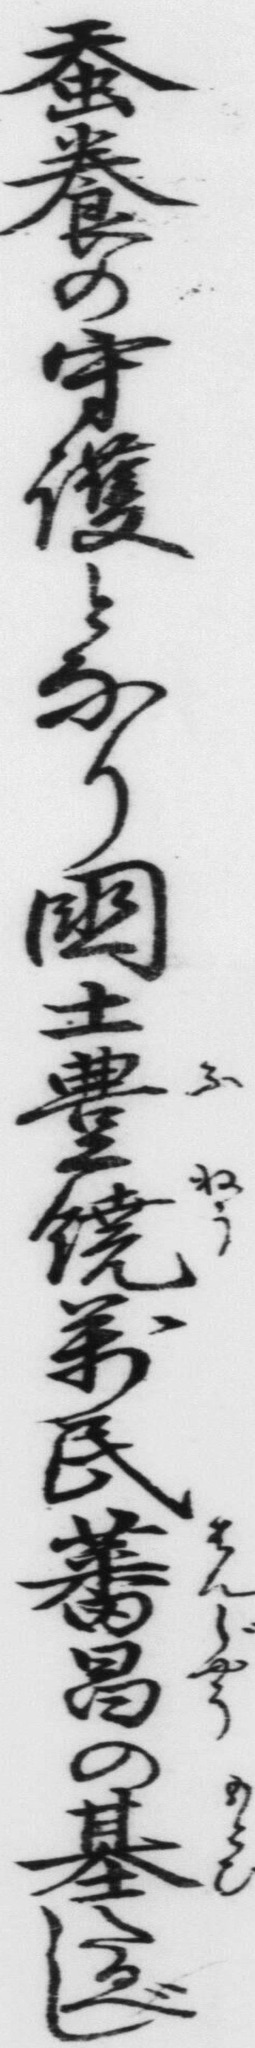蚕養の守護となり国土豊饒万民蕃昌の基たるべし
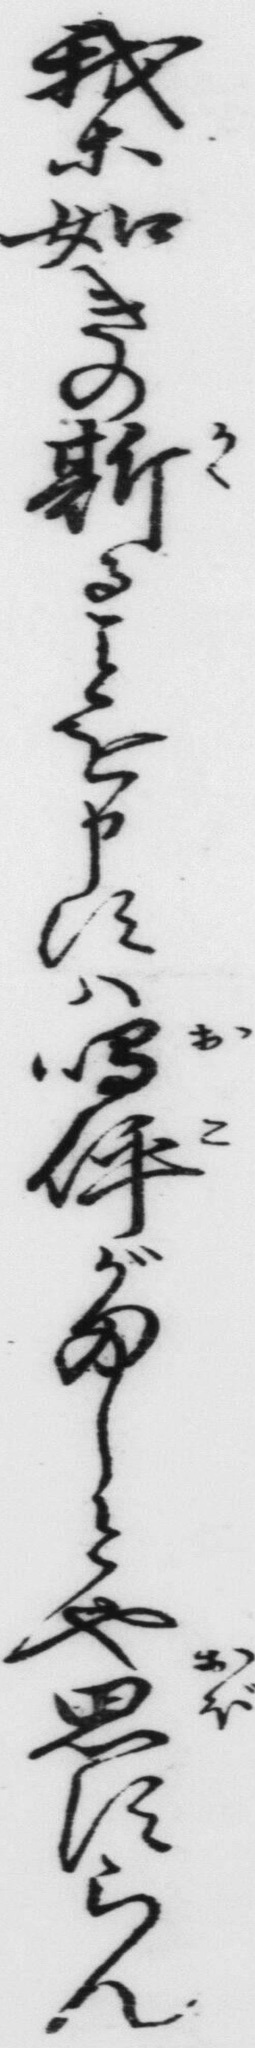我等如きの斯ることを申すは嗚呼がましとや思すらん
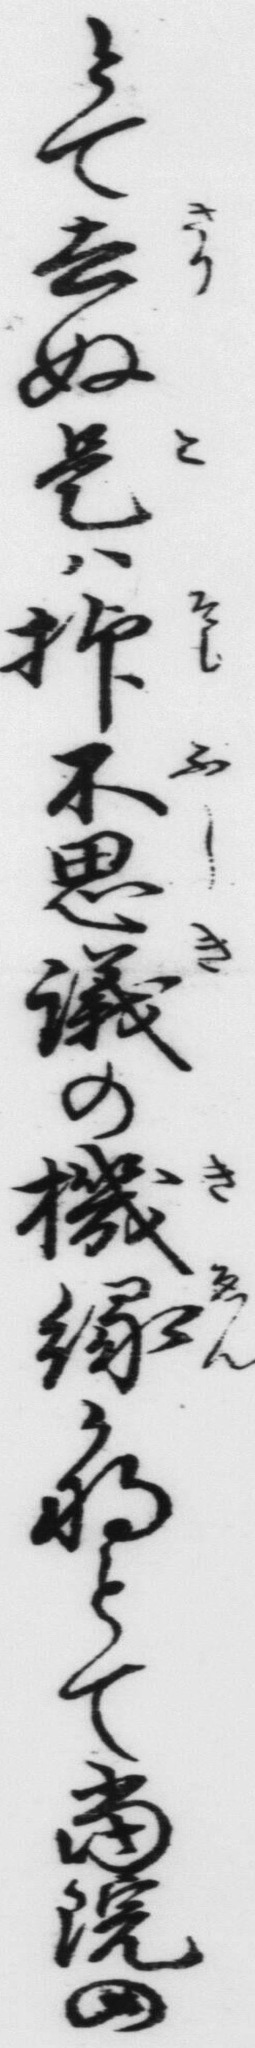とて去ぬ是は抑不思議の機縁かなとて当院の
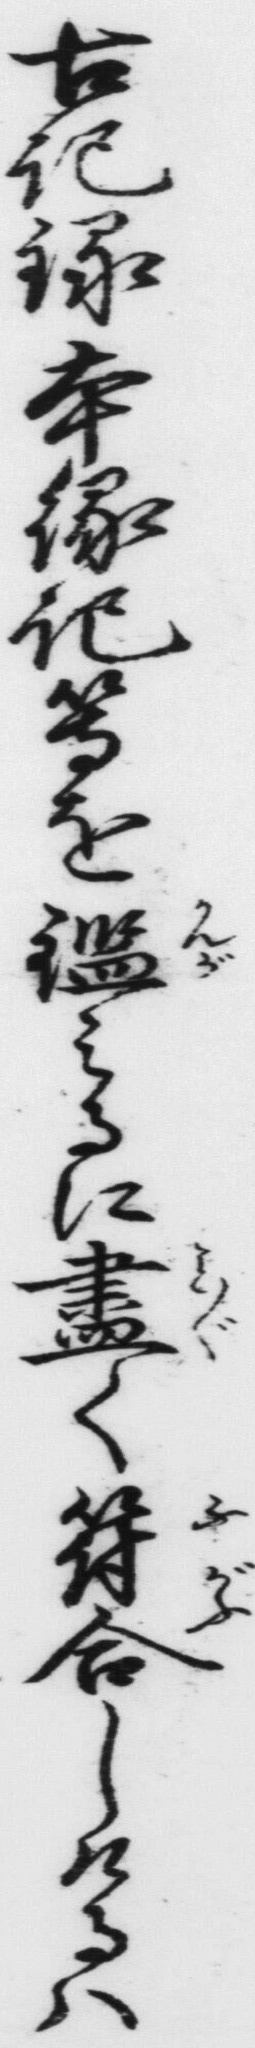古記録本縁記等を鑑みるに尽く符合しけるは
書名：蚕養守護神畧縁起
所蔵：岐阜県図書館 国文学研究資料館
